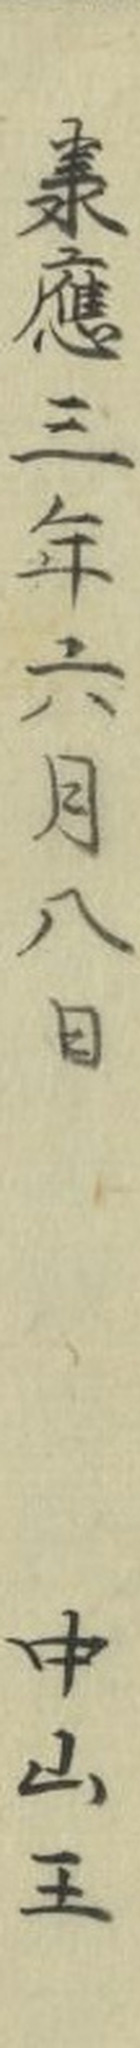承応三年六月八日中山王
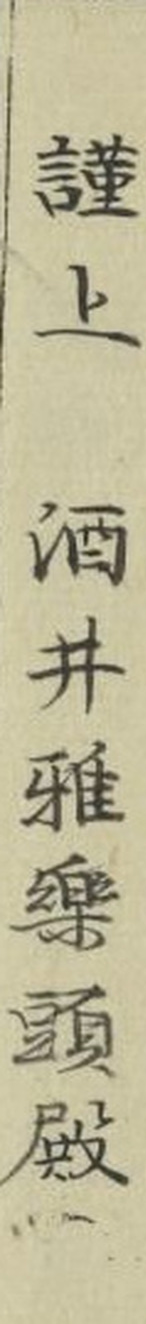謹上酒井讃岐守殿
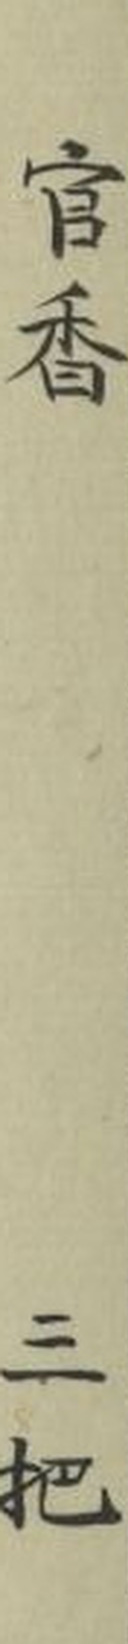官香三把
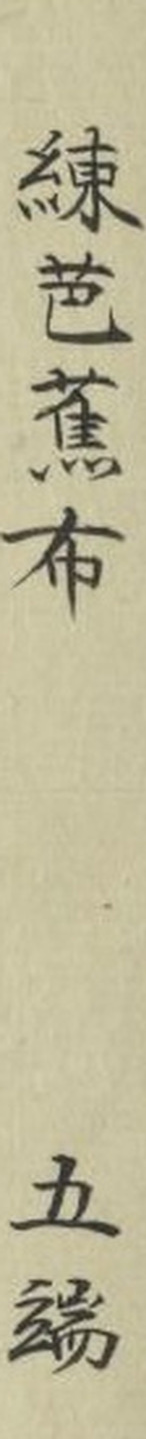練芭蕉布五端
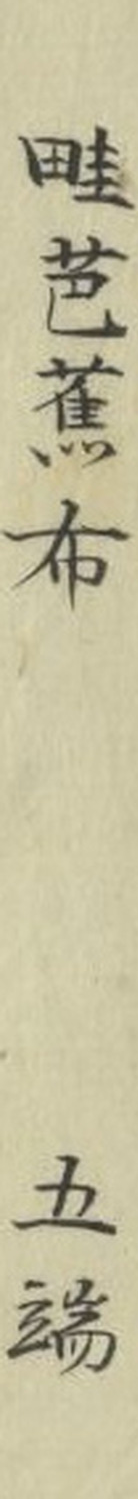練芭蕉布五端
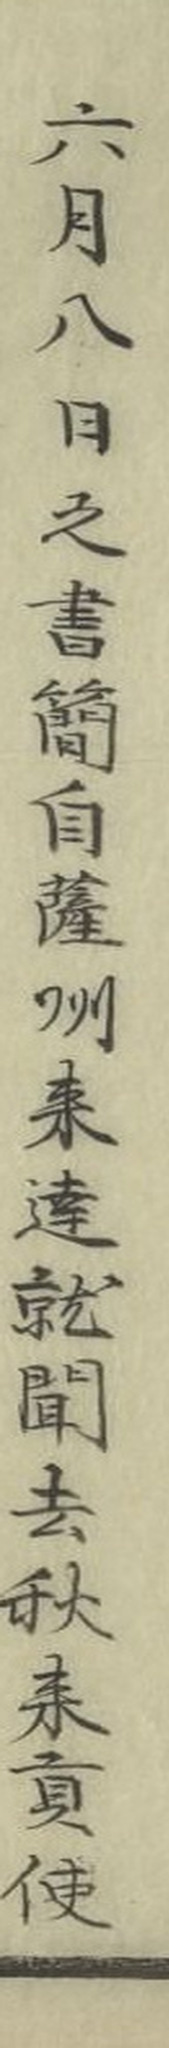六月八日之書簡自薩州来達就聞去秋来貢使
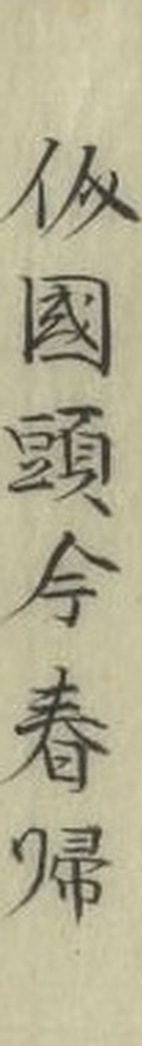价国頭令春帰
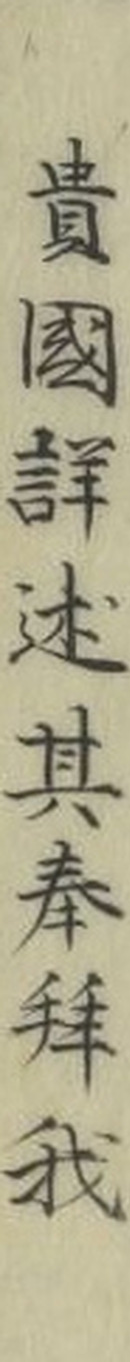貴国詳述其奉拝我

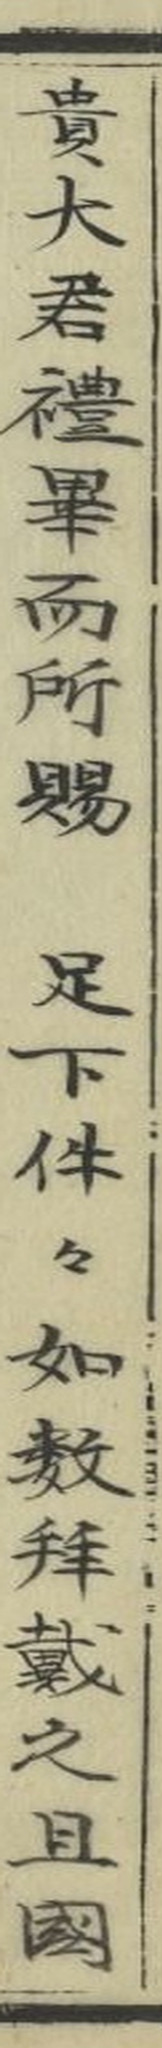貴大君礼畢而所賜足下件々如数拝載之且国
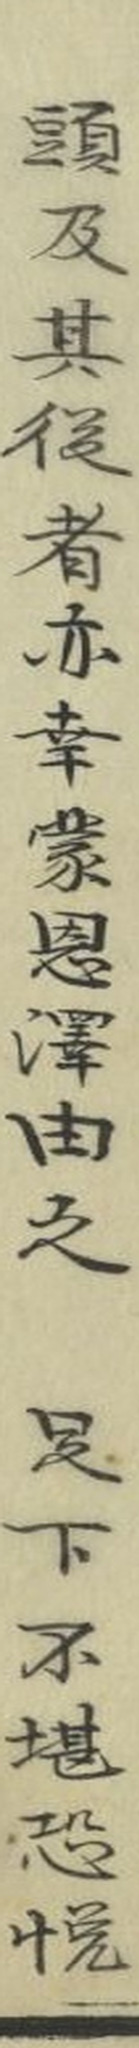頭及其従者亦幸蒙恩沢由之足下不堪恐悦
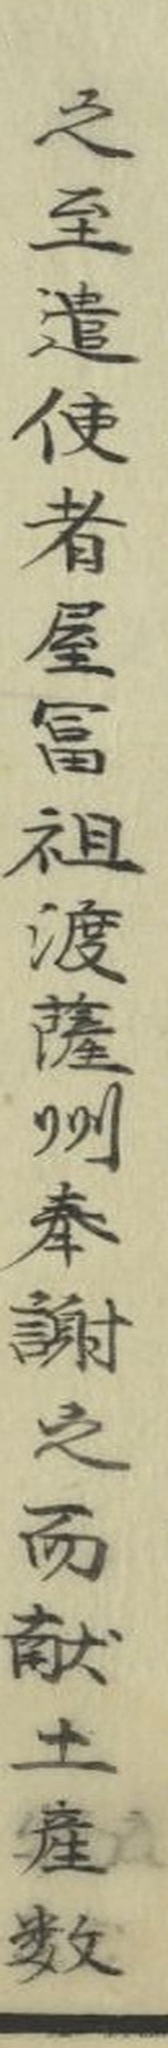之至遣使者屋富祖渡薩州奉謝之而献土産数
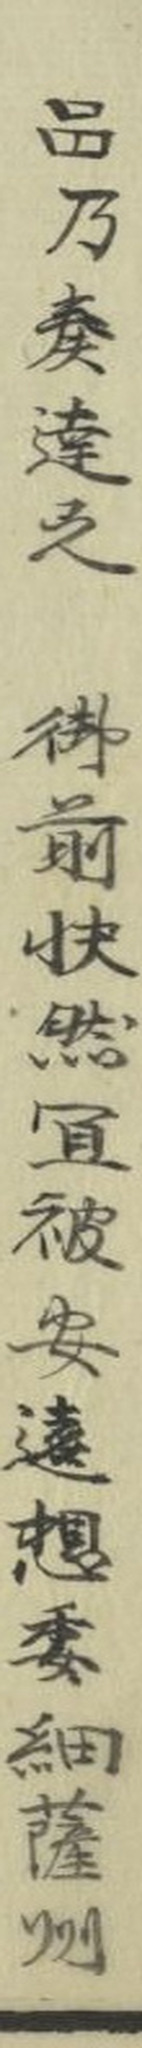品乃奏達之御前快然冝被安達想委細薩州
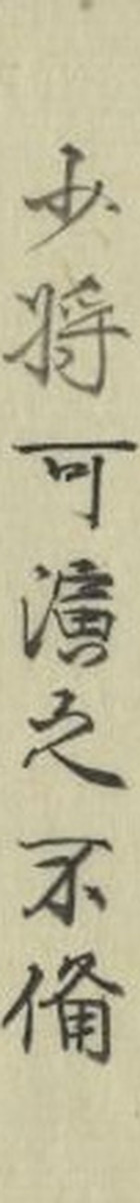少将可演之不脩
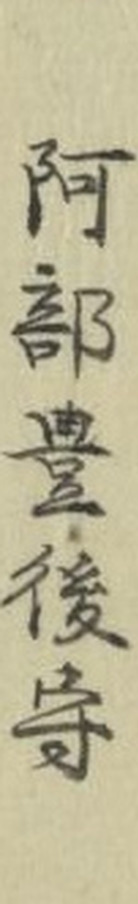阿部豊後守
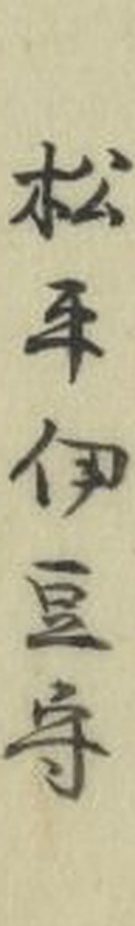松平伊豆守
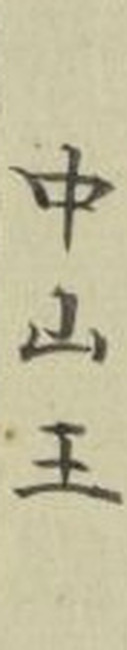中山王
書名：琉球往来（上）
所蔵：University of the Ryukyus Library
